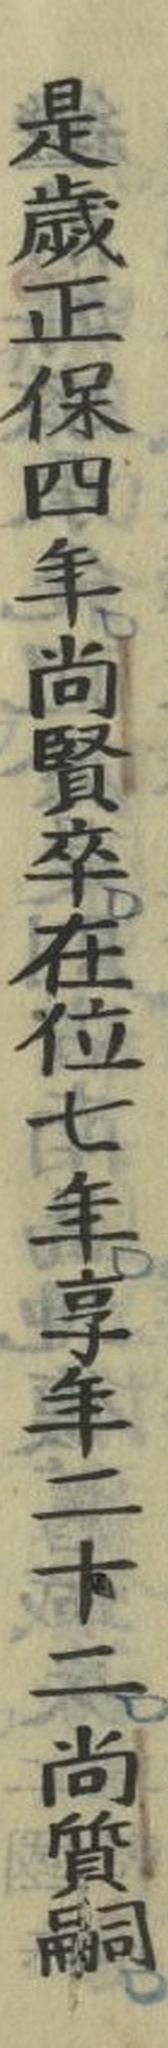是歲正保四年。尚賢卒。在位七年。享年二十二。尚質嗣。
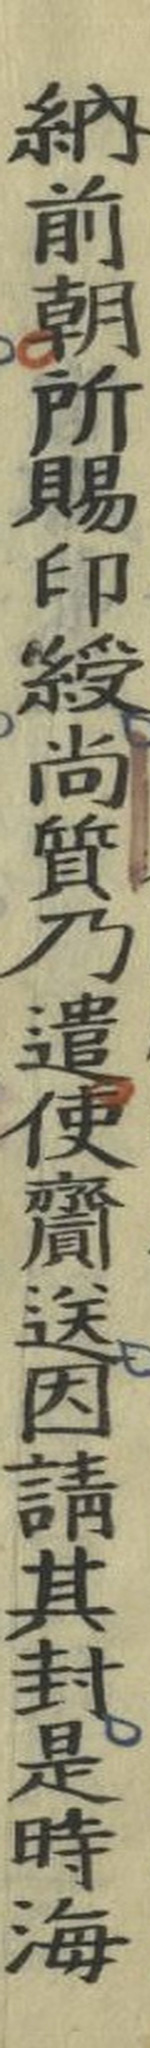納前朝所賜印綬。尚質乃遣使齎送。因請其封。是時
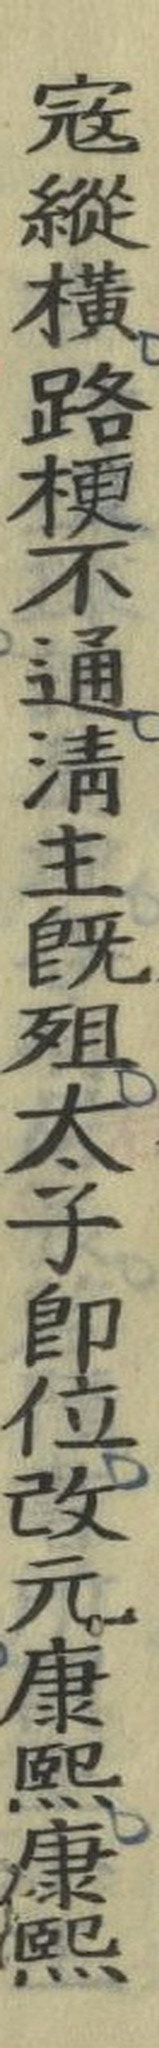寇縱横。路梗不通。淸主既殂。太子卽位。改元康熙。康熙
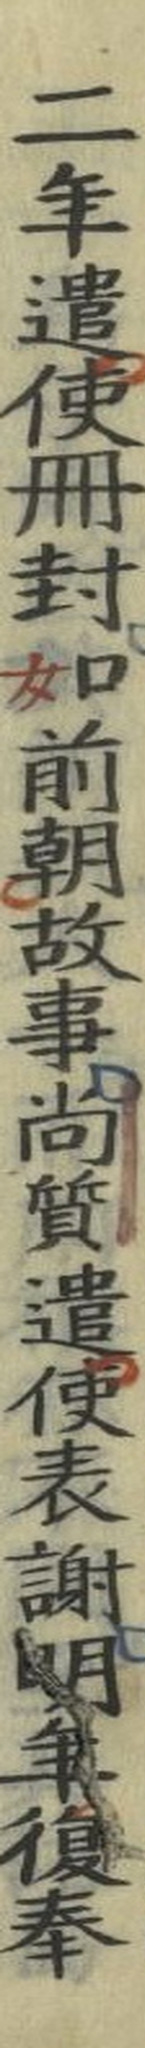二年遣使冊封。如前朝故事。尚質遣使表謝。明年復奉
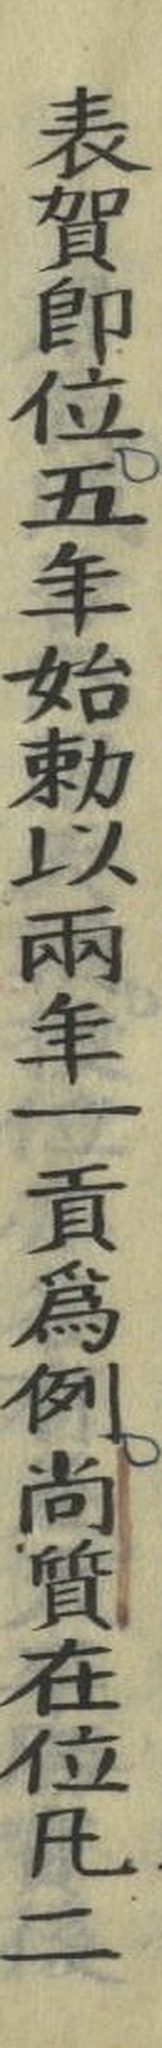表賀卽位。五年始勅以兩年一貢爲例。尚質在位凡二
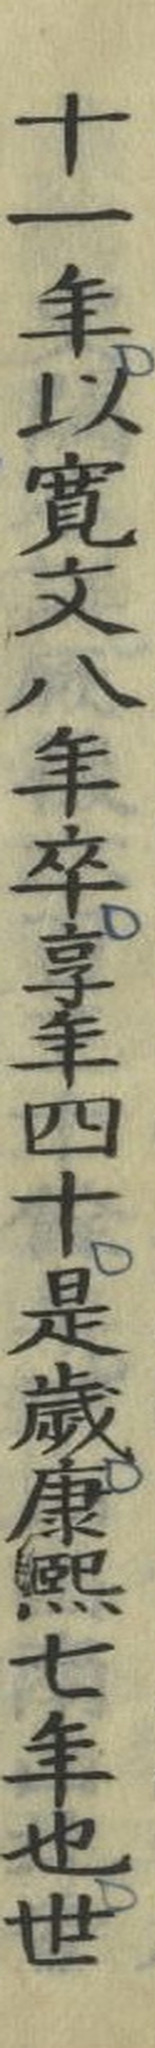十一年。以寛文八年卒。享年四十。是歲康熙七年也。世
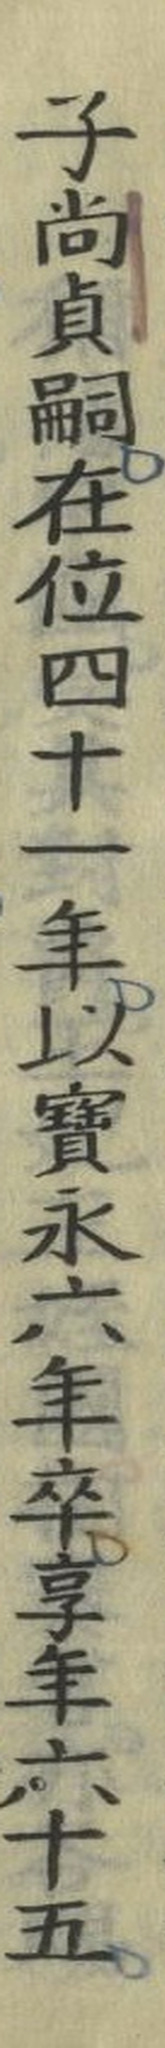子尚貞嗣。在位四十一年。以寶永六年卒。享年六十
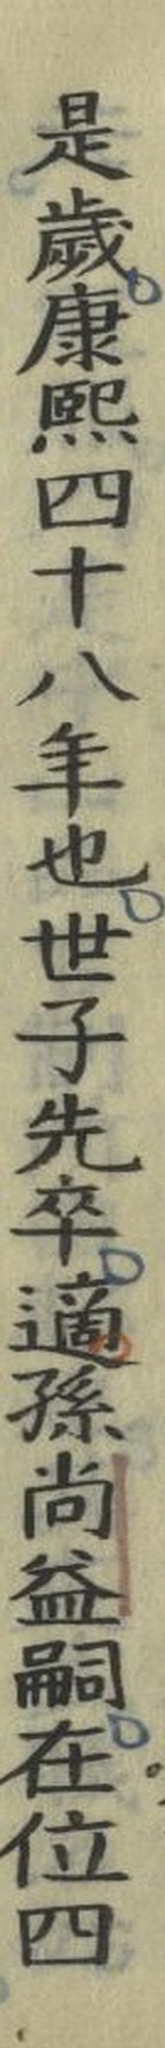是歲。康熙四十八年也。世子先卒。適孫尚益嗣。在位四
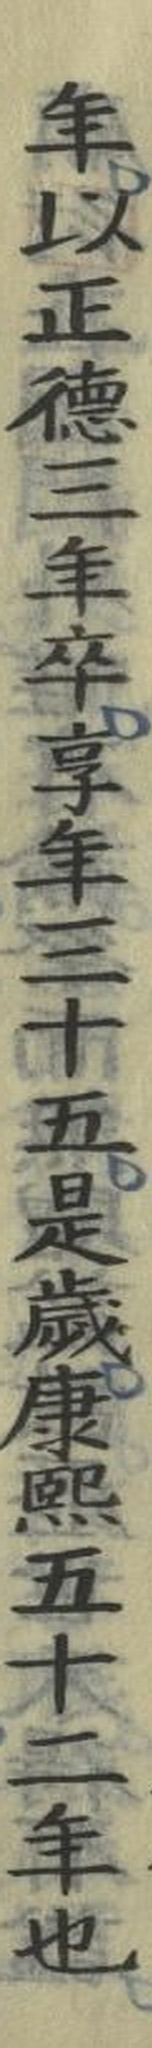年。以正德三年卒。享年三十五。是歲康熙五十二年
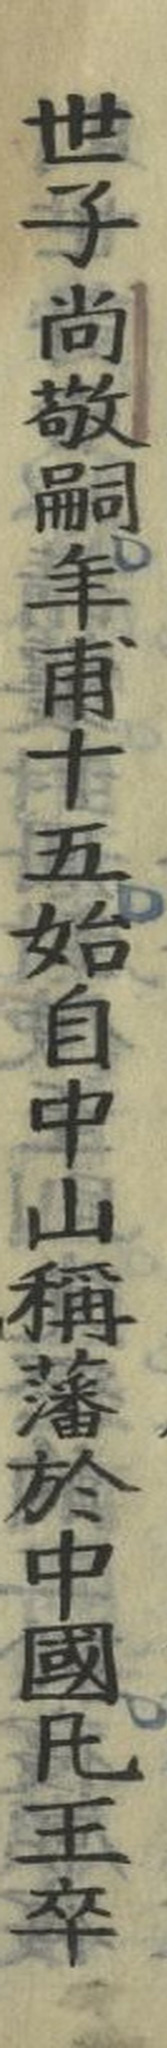世子尚敬嗣。年甫十五。始自中山稱藩於中國。凡王卒

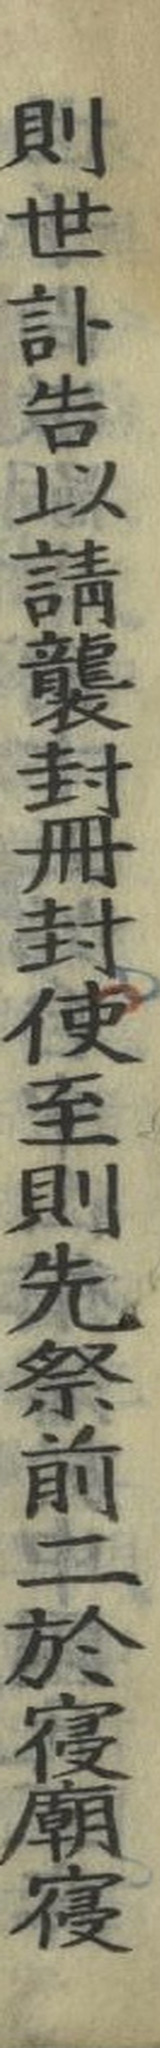則世訃告以請襲封冊封。使至則先祭前二於寝廟寝
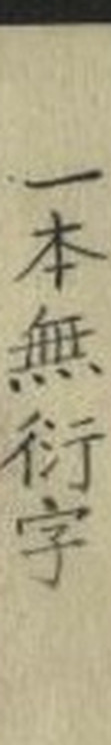一本無衍字
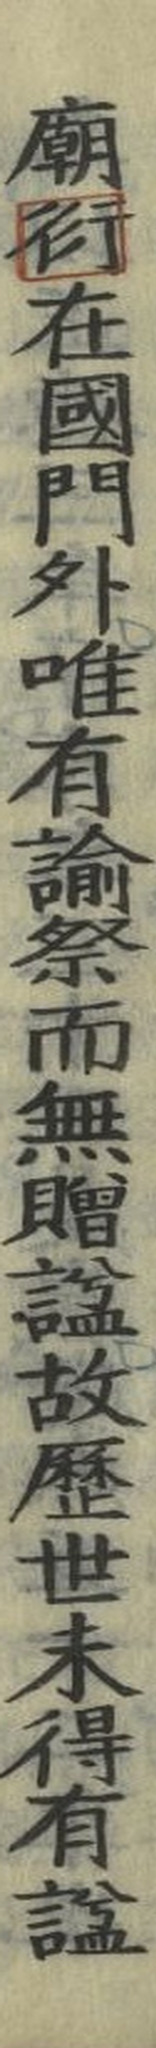廟衍在國門外。唯有諭祭而無贈諡。故歴世末得有諡
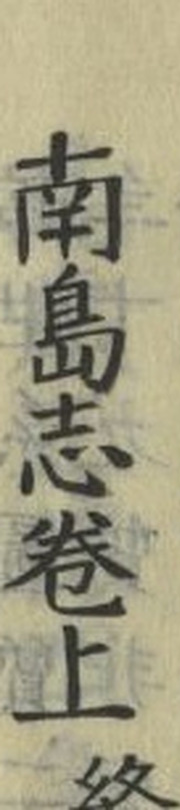南島志卷下
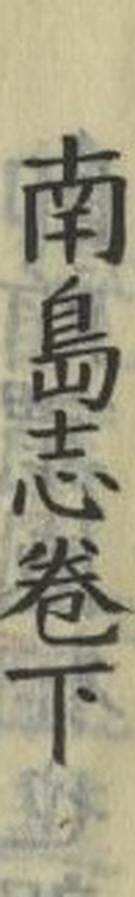南島志卷下
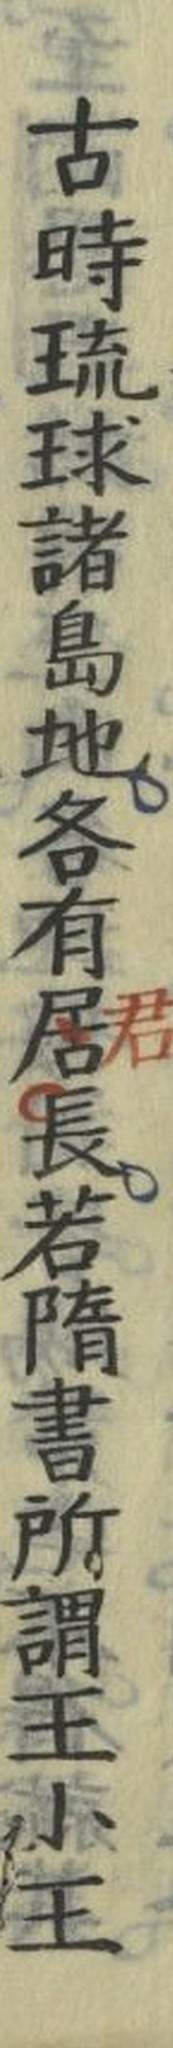古時琉球諸島地。各有居君長。若隋書所謂王小王
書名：南島志
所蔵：University of the Ryukyus Library
